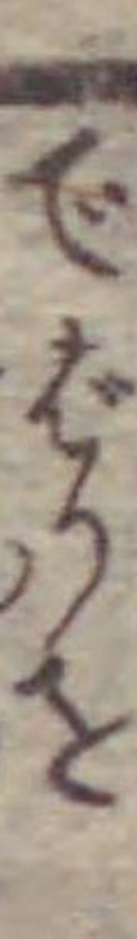でばりを
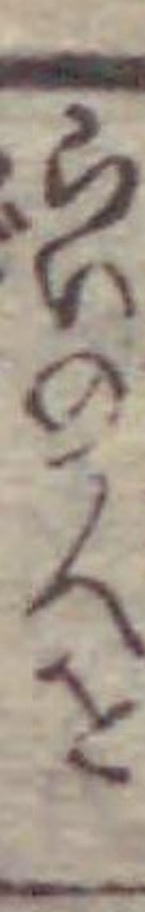らいの人を
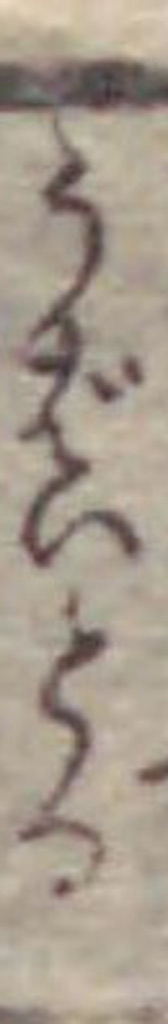うばいとる
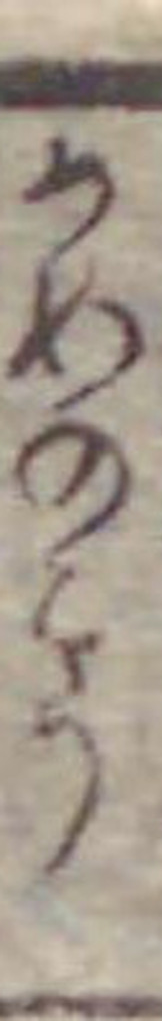かめのこう
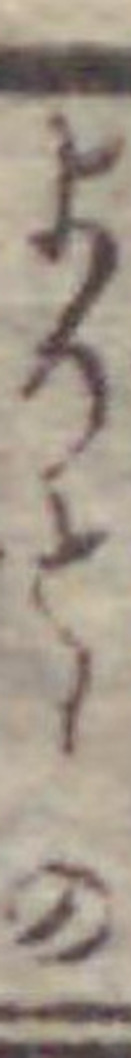よりとしの
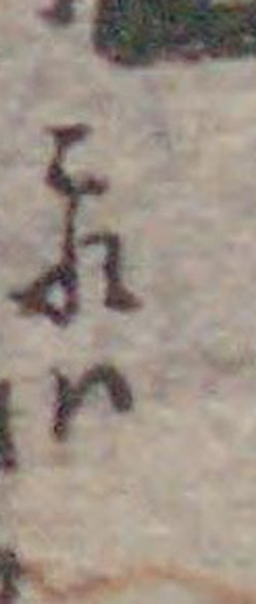これは
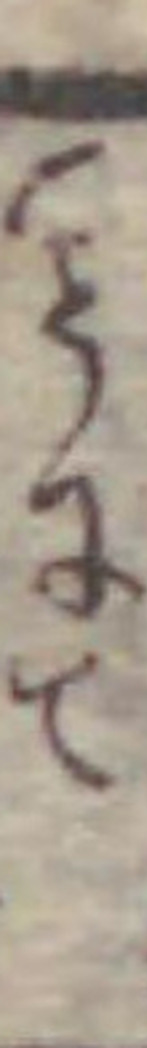こうにて
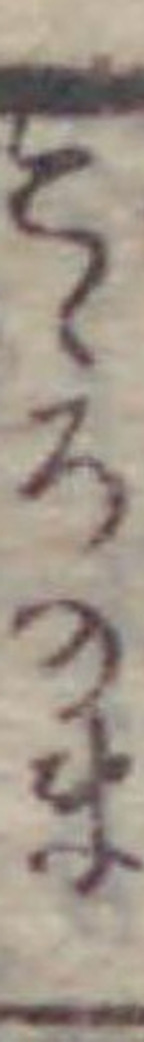こゝろのま
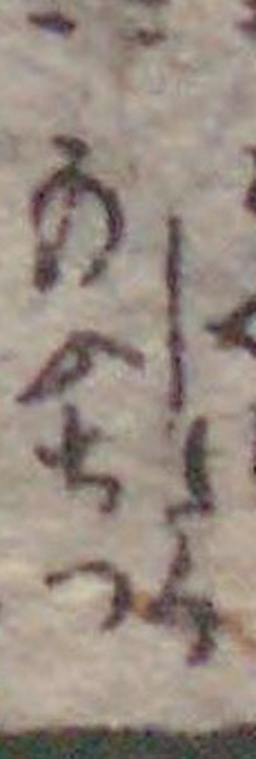もふちつ
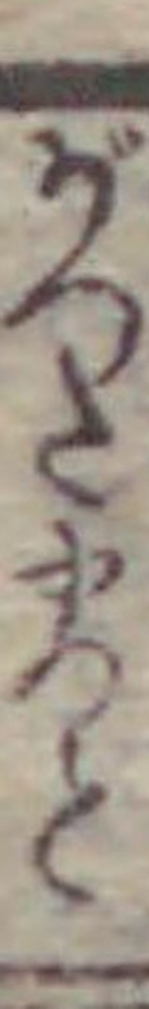がつたやつと
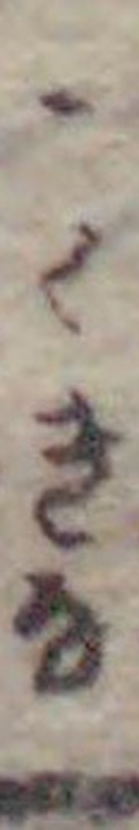くきな
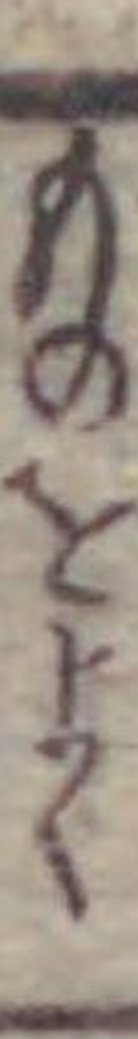ものをよく
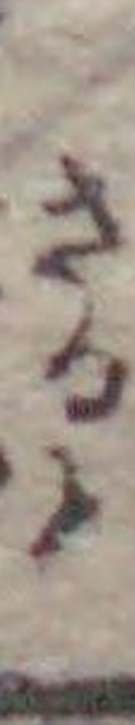さると
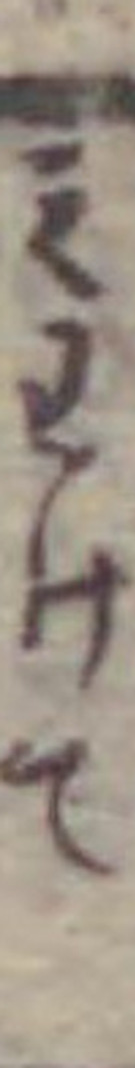みわけて
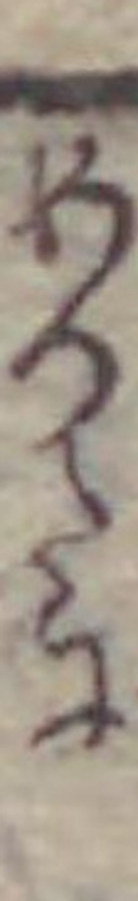めつたに
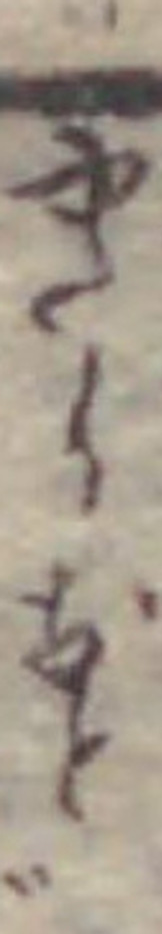やたらおと
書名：化物見世開 : 2巻
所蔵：国立国会図書館 National Diet Library, JAPAN
